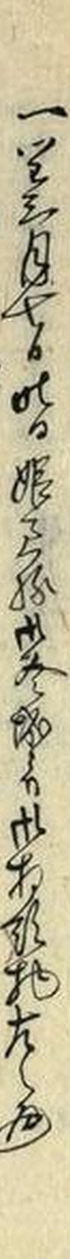一閏三月七日昨日姫君様御登城ニ付御拝領物左之通
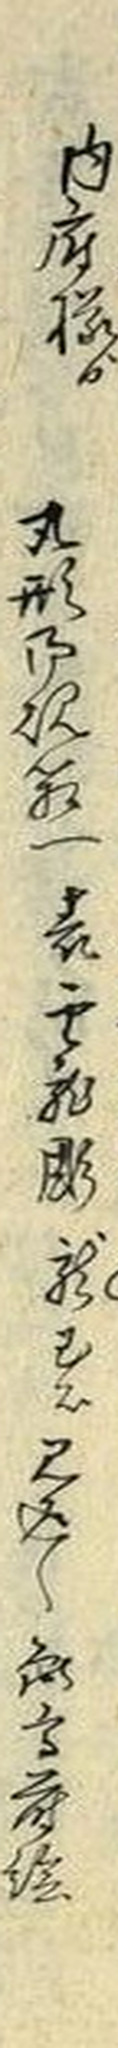内府様ゟ丸形御硯箱一表雲龍彫龍王石見返し亀高蒔絵
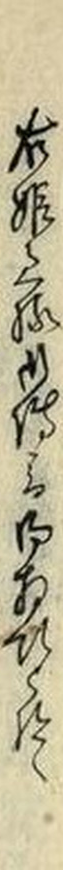右姫君様御伝ニ而御拝領被遊候
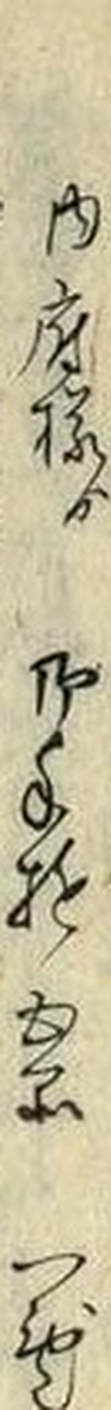内府様ゟ御手遊五品一台
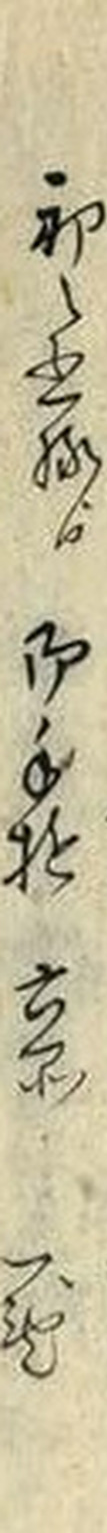初之丞様ゟ御手遊六品一台
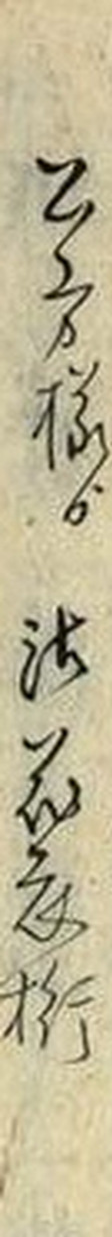公方様ゟ銀花衣桁一
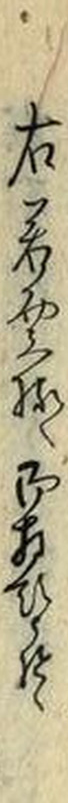右若殿様へ御拝領被遊候
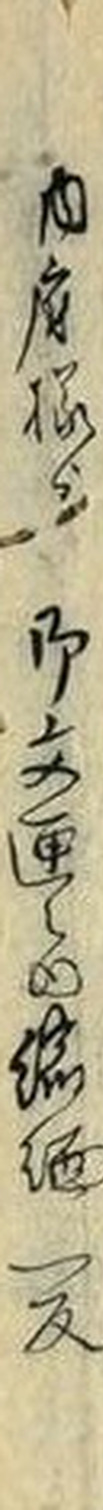内府様ゟ御文匣之内縮緬一反

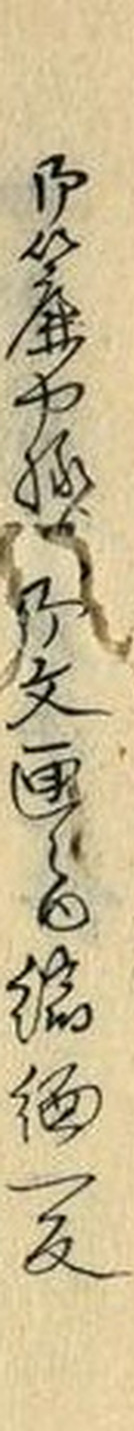御簾中様ゟ御文匣之内縮緬一反
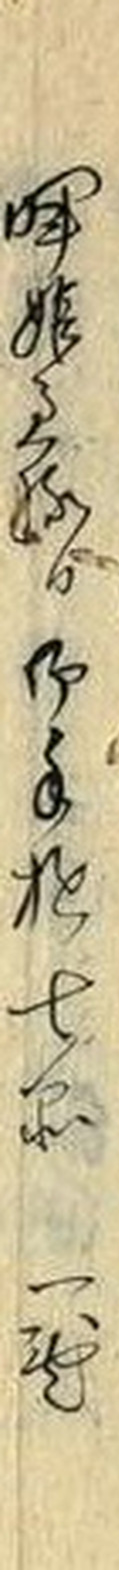暉姫君様ゟ御手遊七品一台
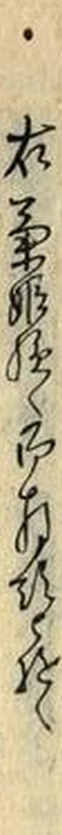右菊姫様へ御拝領被遊
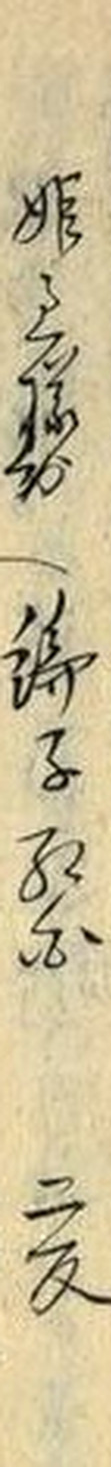姫君様ゟ綸子紅白二反
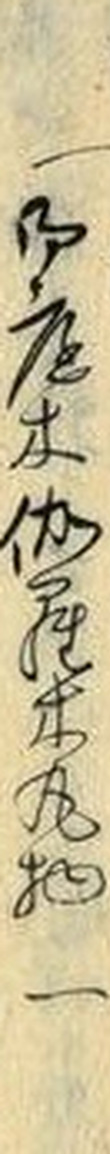御庭木伽羅木丸物一
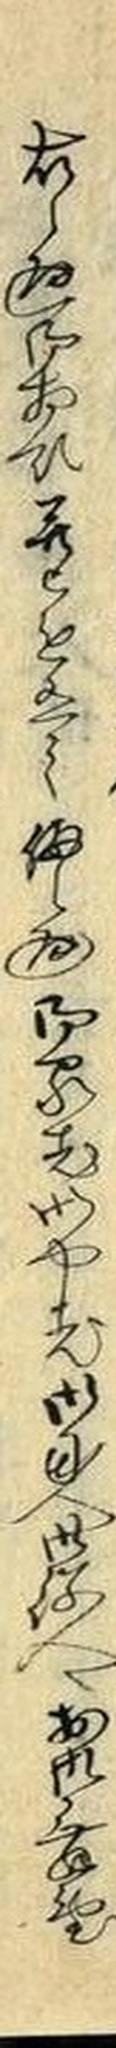右之通御拝領并被進有之例之通御家老御中老御用人御役人へ於御舞台
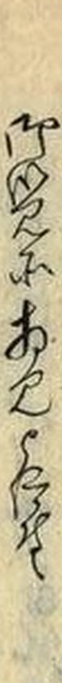御覧所拝見被仰付候
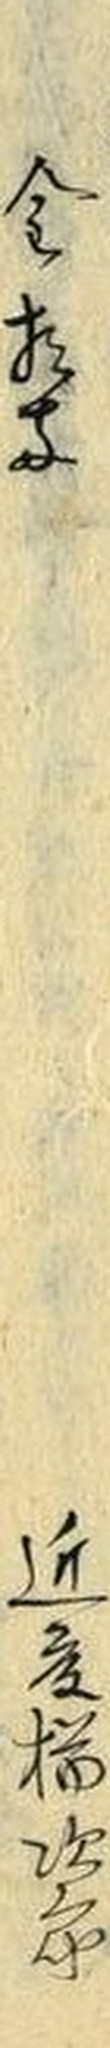金拾両近藤猶次郎
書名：少傅日録抄（斉承付側向頭取日記、在府）
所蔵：福井県文書館 Fukui Prefectural Archives
